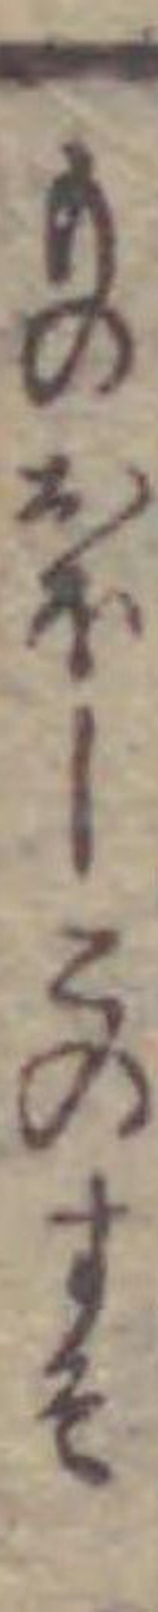ものおほしこのすそ
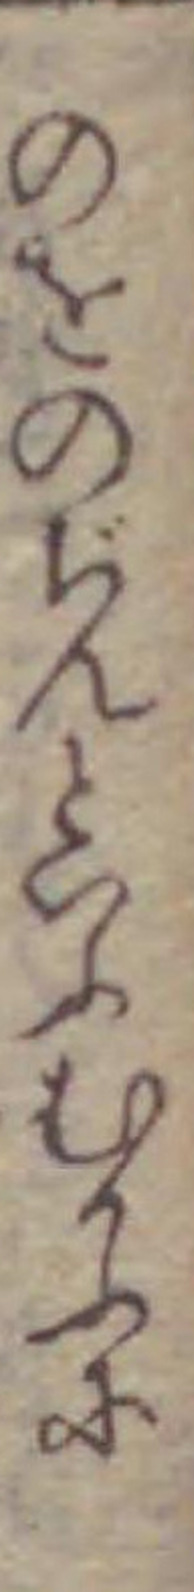のをのぢんといふむかふに
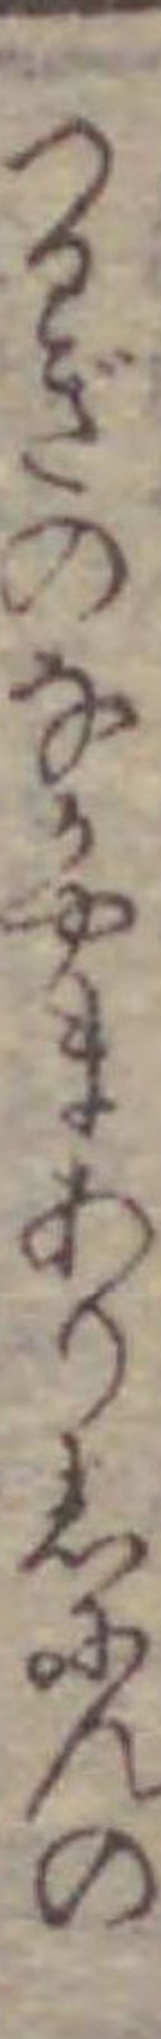つるぎのなかやまありしにんの
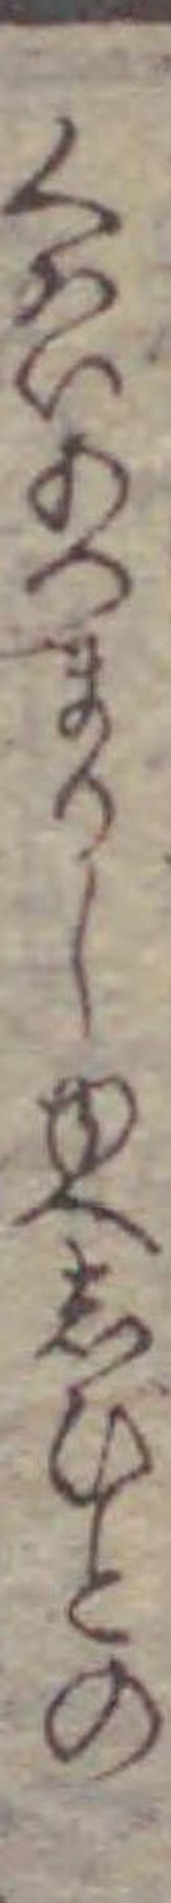くはいあつまりしゆへしびとの
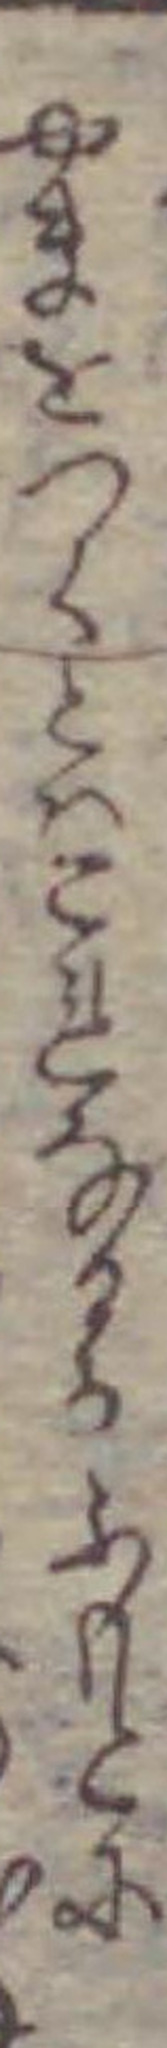やまをつくとはこれなるかふもとに
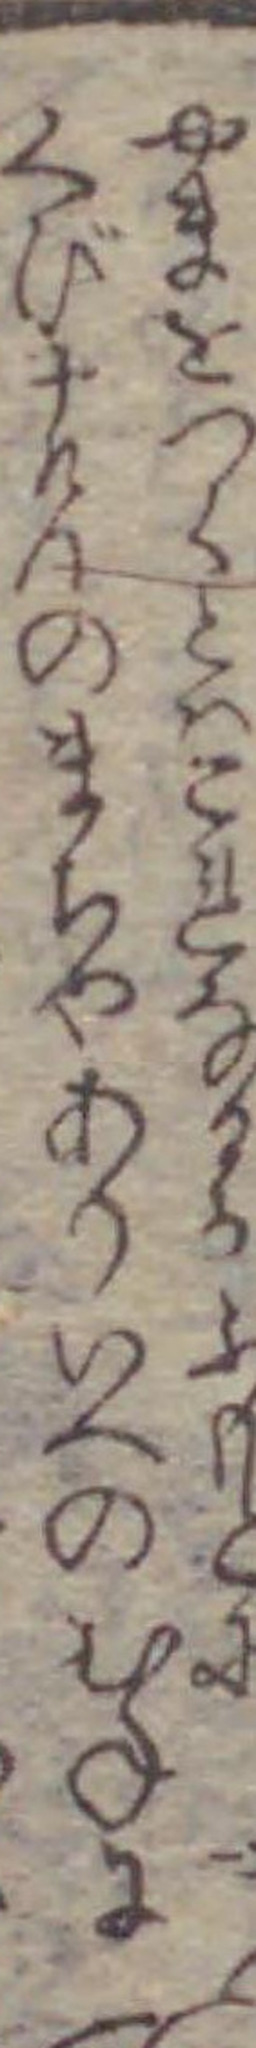くび十けんのまちやありいへのむねに
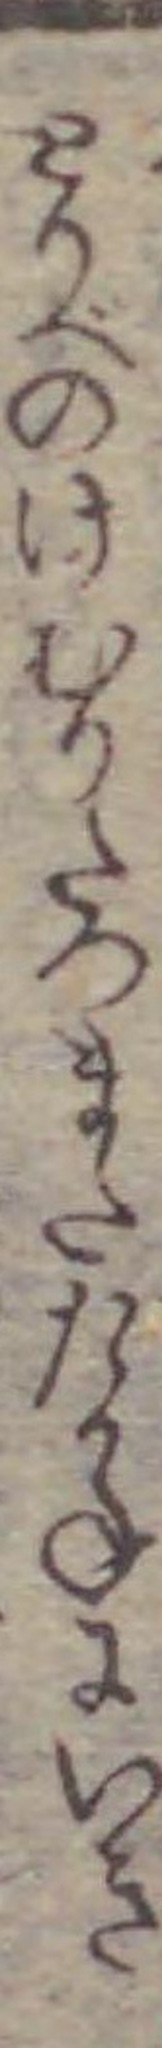とりべのけむりたつまたたかねにいき
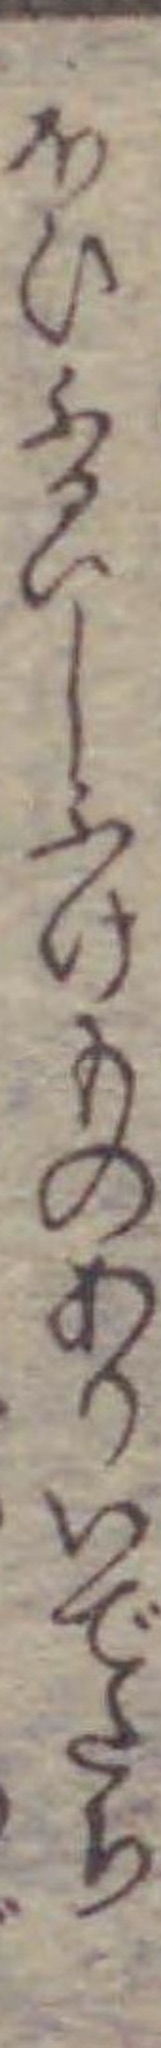ほいふるいしふけものありいでたち
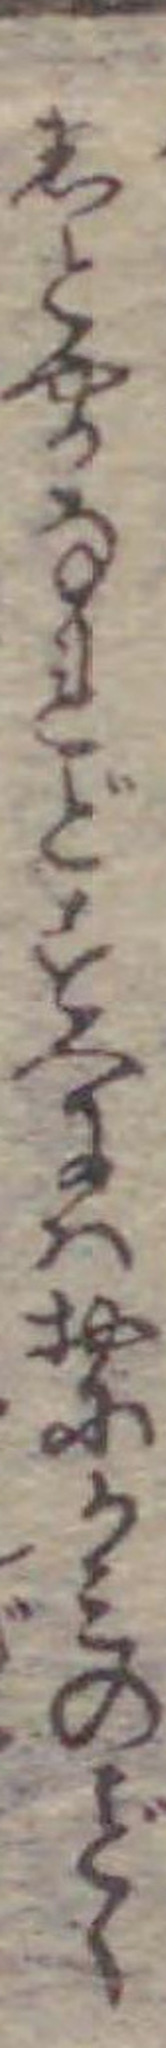しとやかなれどすへにはおふかみのごとく
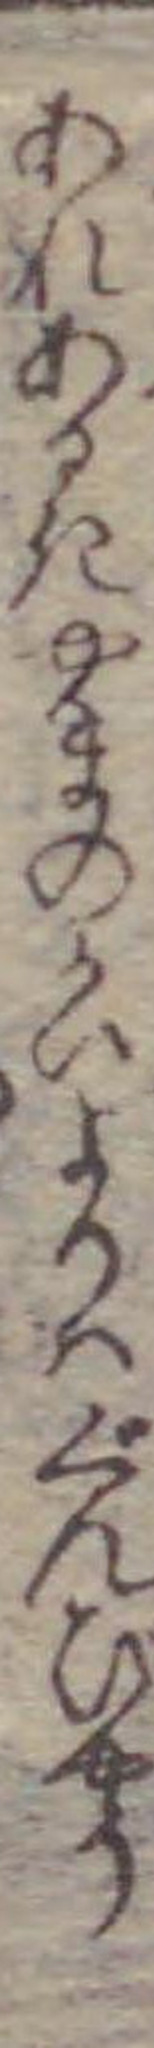あれあるきやまのかいよりはぐんびやう
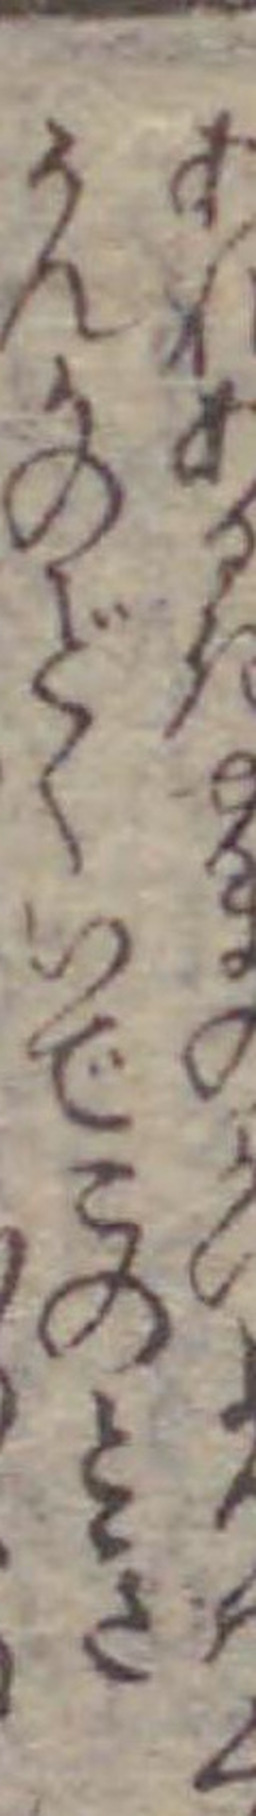うんかのごとくいでこのとき
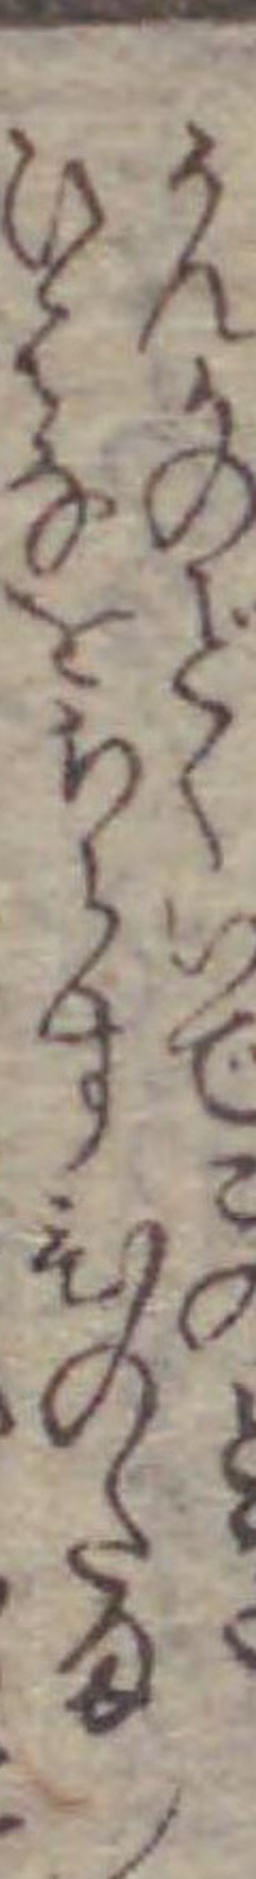ひはなをちらすひのたま
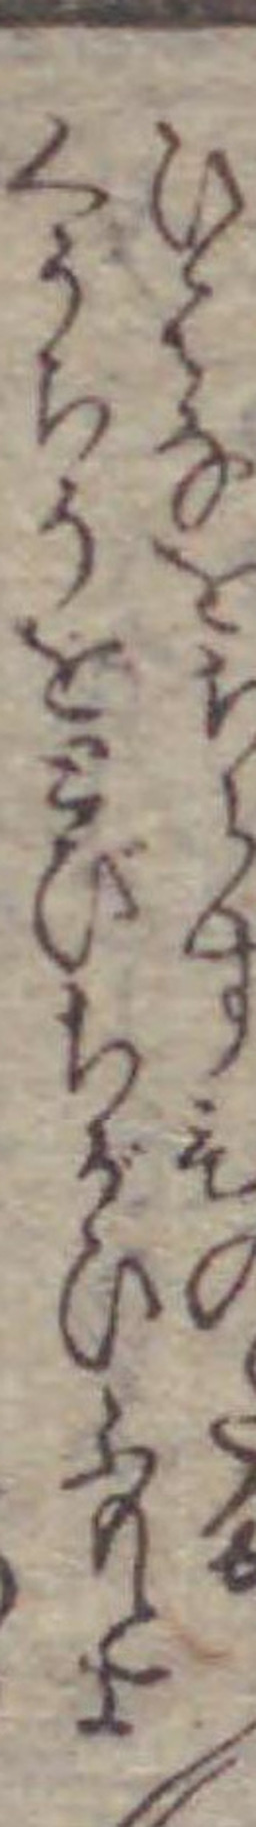くうちうをとびちがひふもとに
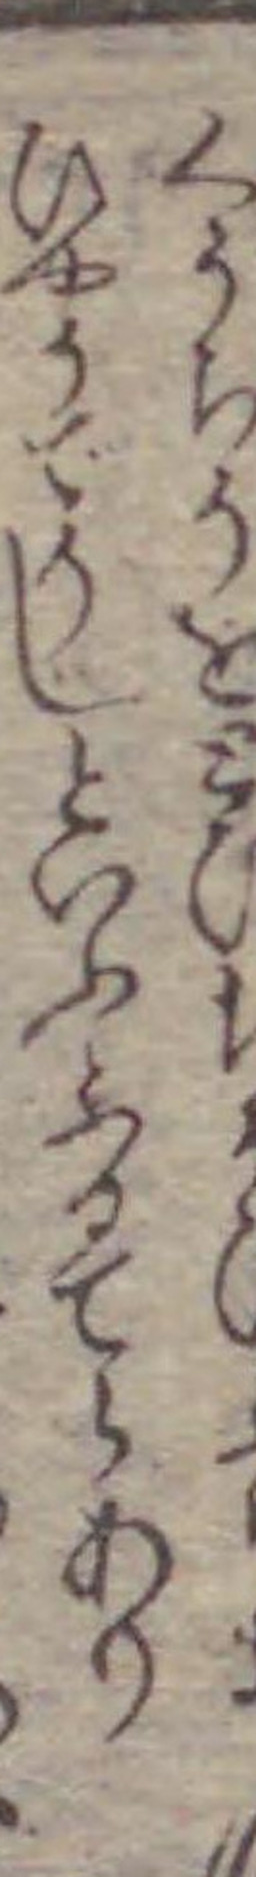ひやうでうしといふふるてらあり
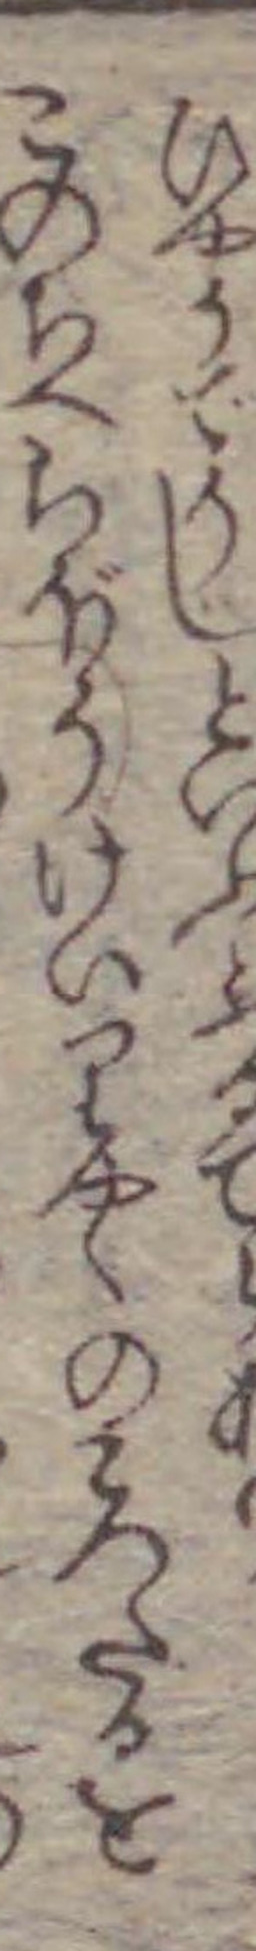このちへちぼうけいりやくのこつたるを
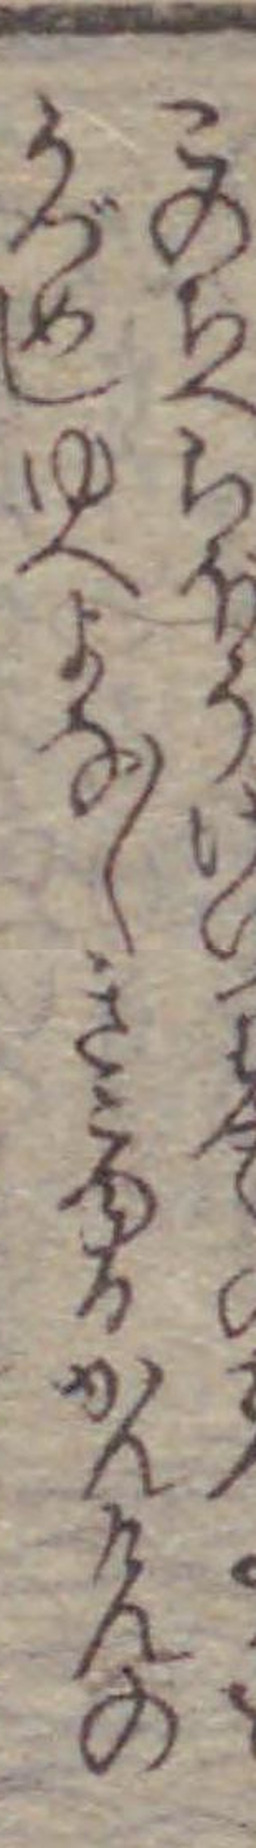うづめしゆへよな〳〵きこゆるかんけんの
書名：武家物奇談 : 3巻
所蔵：国立国会図書館 National Diet Library, JAPAN
